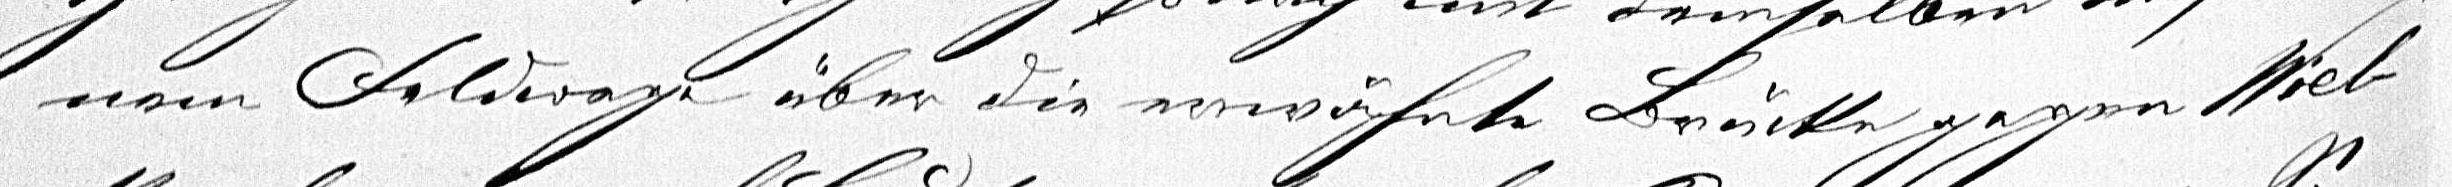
nem Feldwege über die erwähnte Brücke gegen Wieb
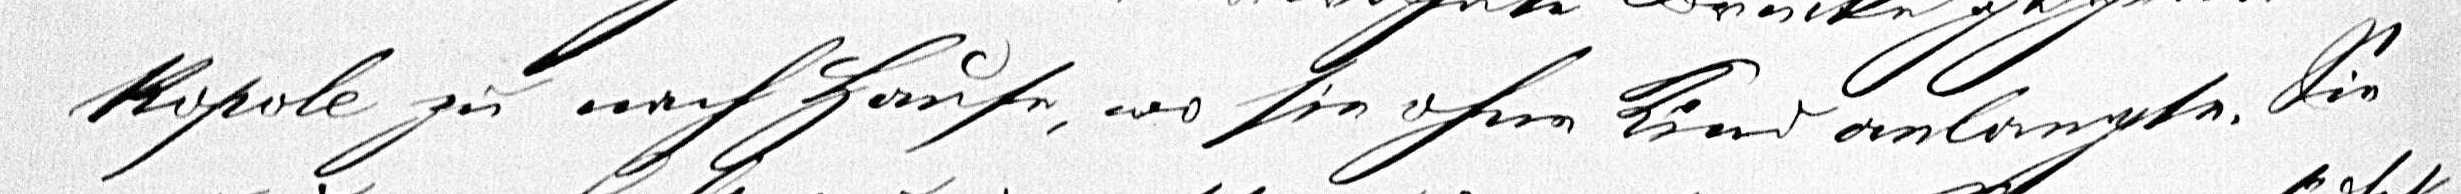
kopole zu nach Hause, wo sie ohne Kind anlangte. Sie
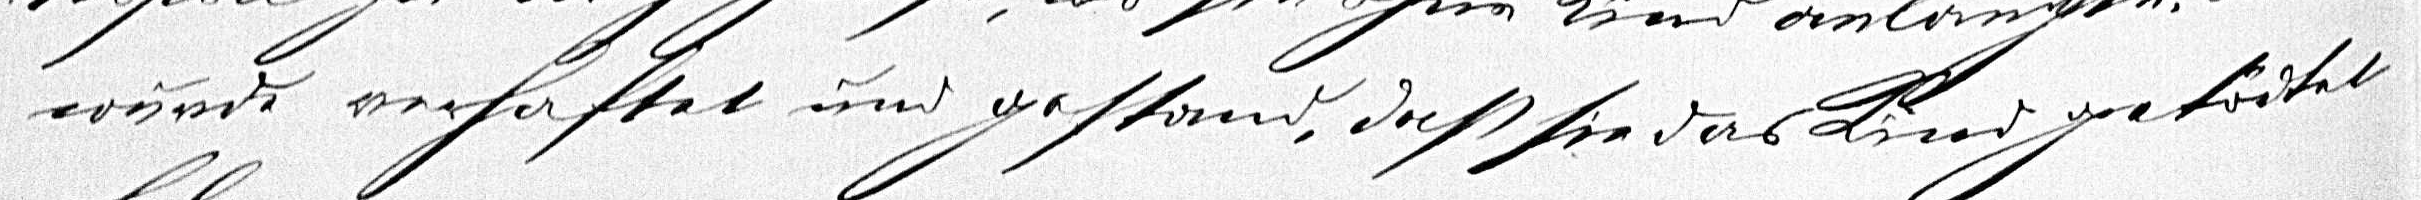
wurde verhaftet und gestand, daß sie das Kind getödtet
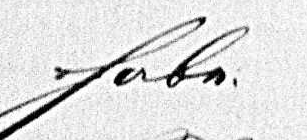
habe.
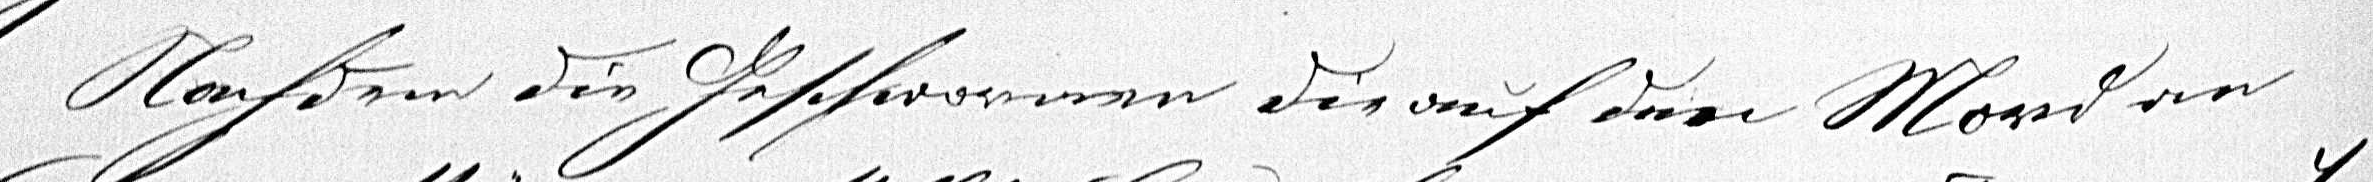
Nachdem die Geschwornen die auf den Mord an
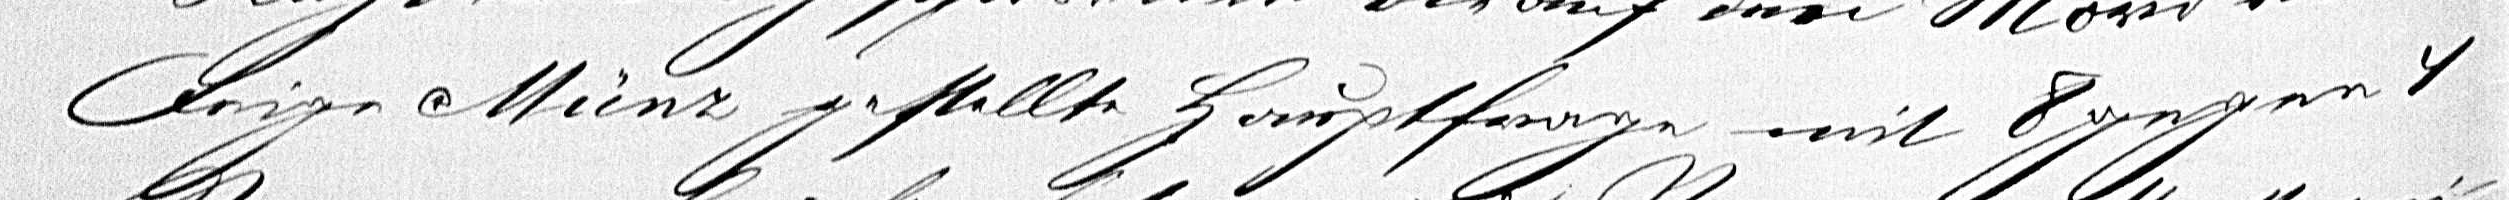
Feige Münz gestellte Hauptfrage mit 8 gegen 4
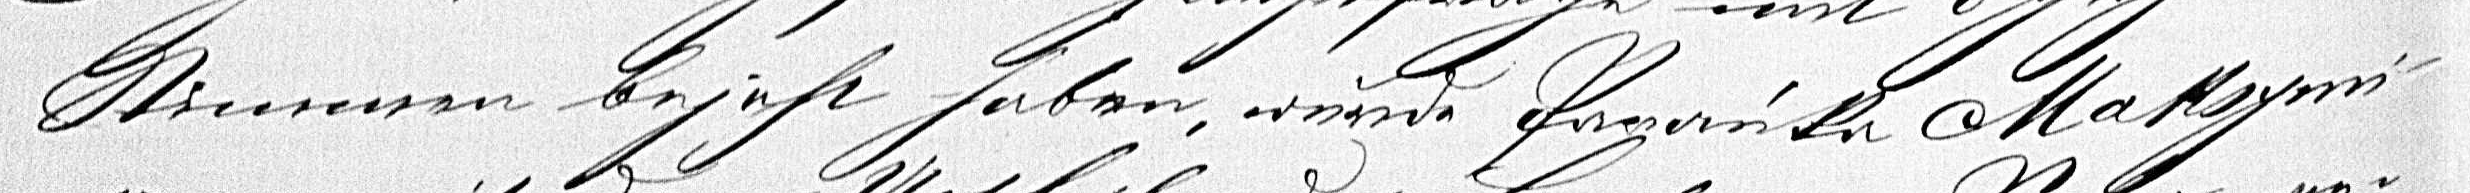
Stimmen bejaht haben, wurde Parańka Maksym¬
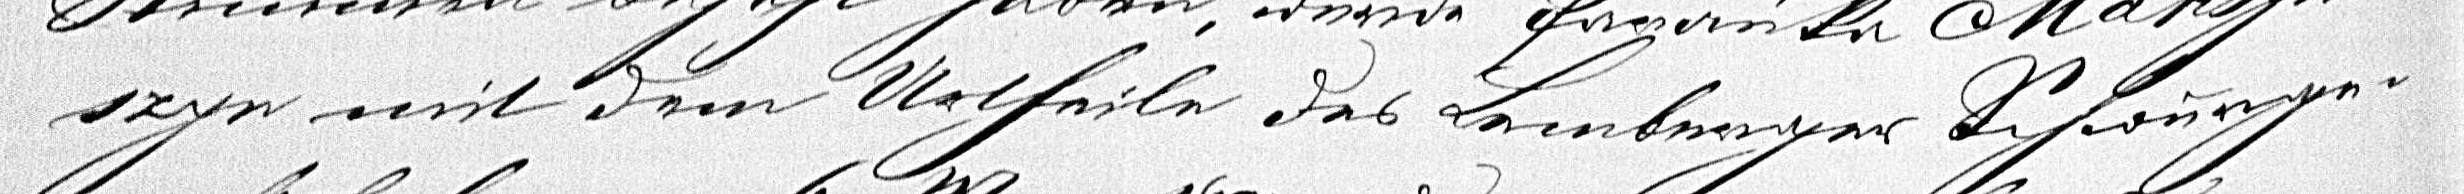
szyn mit dem Urtheile des Lemberger Schwurge¬
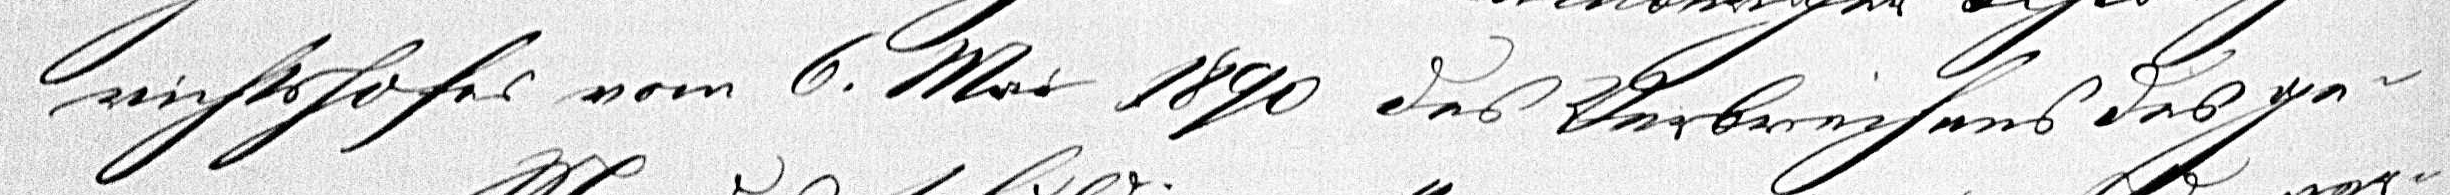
richtshofes vom 6. Mai 1890 des Verbrechens des ge¬
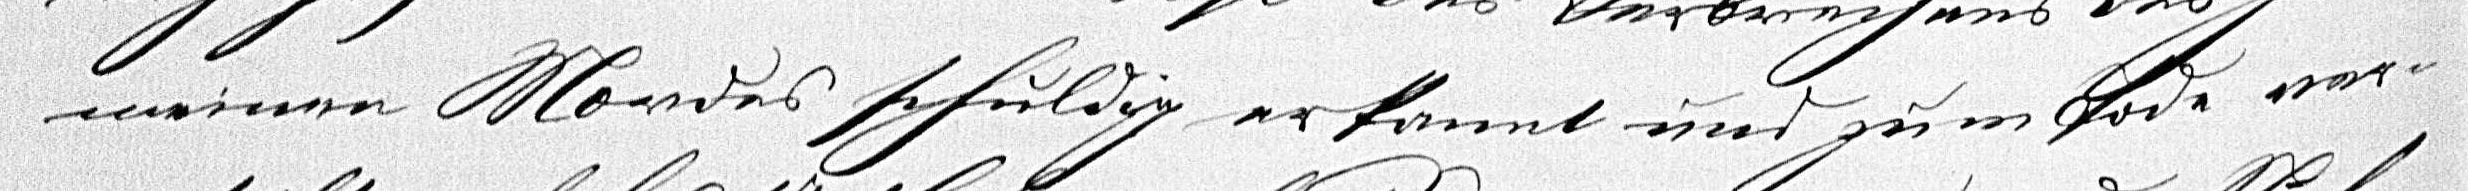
meinen Mordes schuldig erkannt und zum Tode ver¬
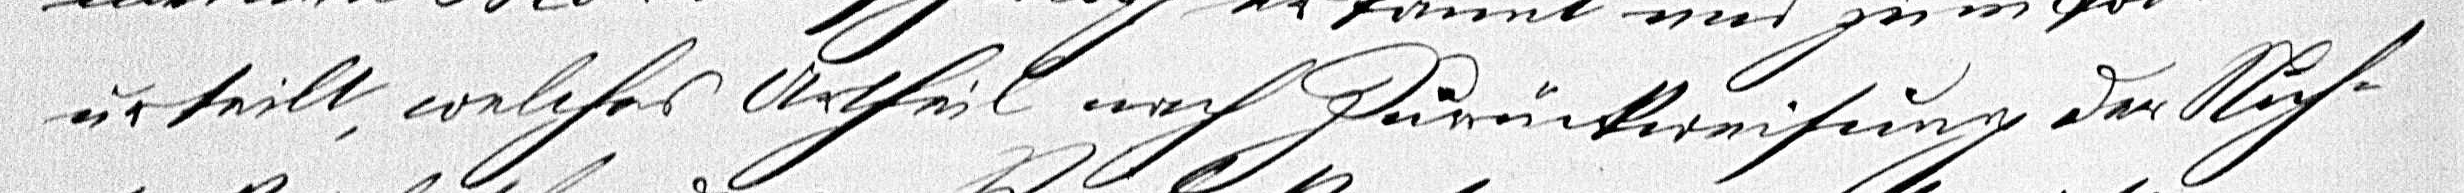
urteilt, welches Urtheil nach Zurückweisung der Nich¬
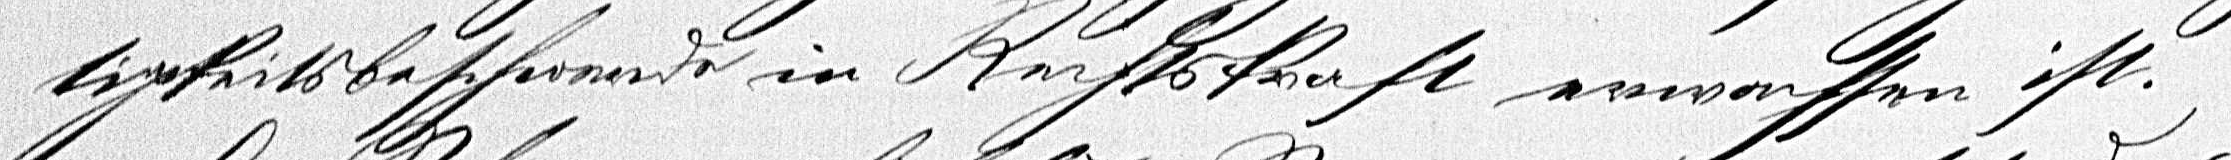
tigkeitsbeschwerde in Rechtskraft erwachsen ist.
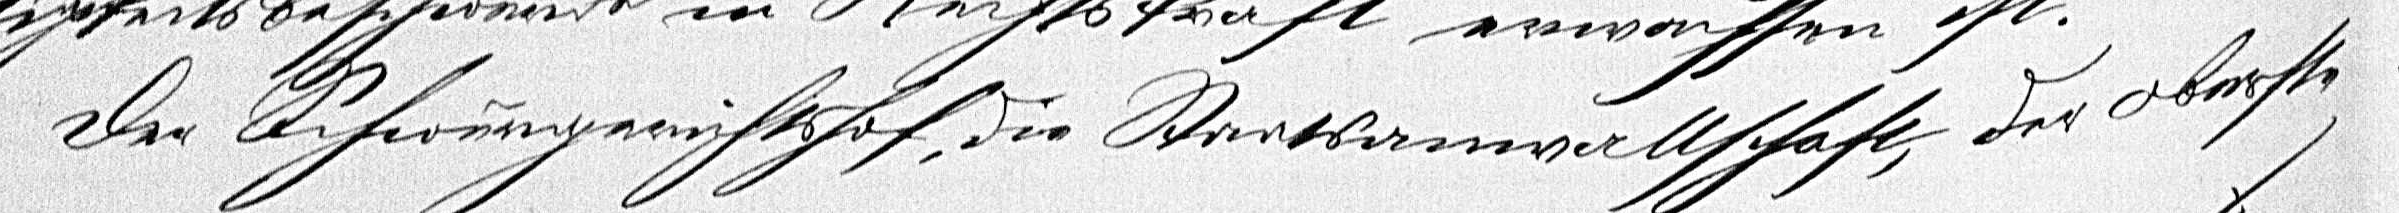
Der Schwurgerichtshof, die Staatsanwaltschaft, der oberste
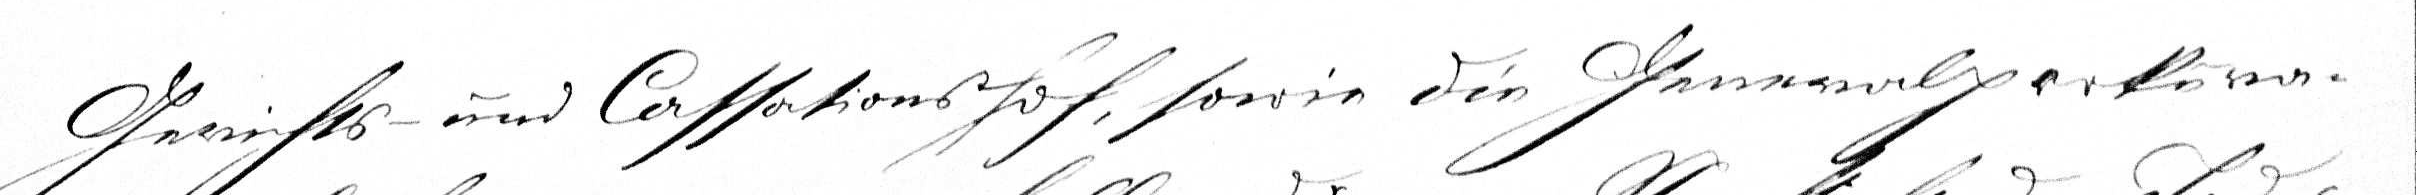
Gerichs- und Cassationshof, sowie die Generalprokura¬
